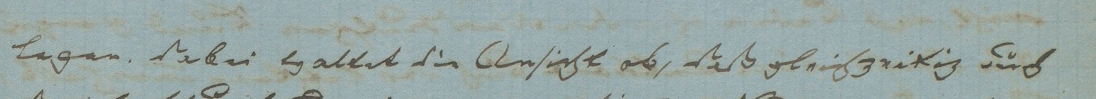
legen. Dabei waltet die Ansicht ob, daß gleichzeitig auch
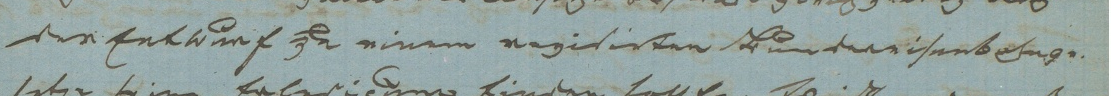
der Entwurf zu einem revidirten Bundeseisenbahnge-
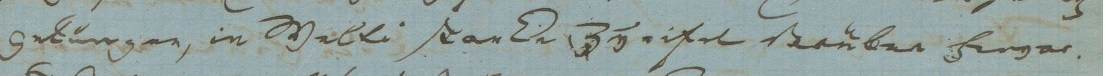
gelungen, in Welti starke Zweifel darüber hervor-
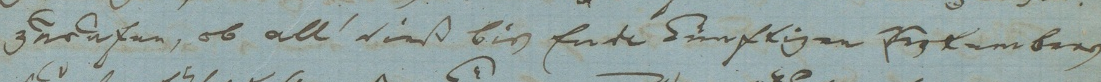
zurufen, ob all' dieß bis Ende künftigen Septembers
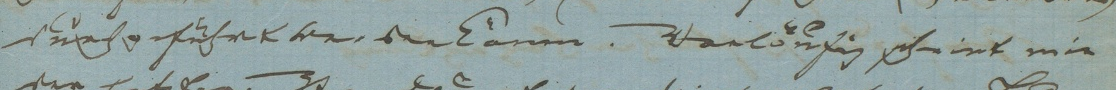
durchgeführt werden könne. Vorläufig scheint mir
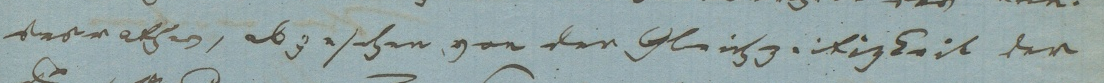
desrathes, abgesehen von der Gleichzeitigkeit der
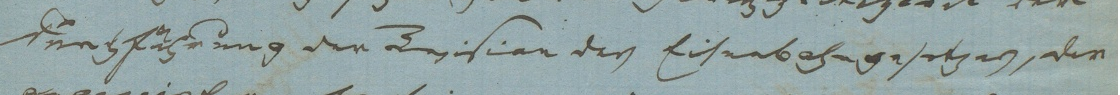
Durchführung der Revision des Eisenbahngesetzes, der
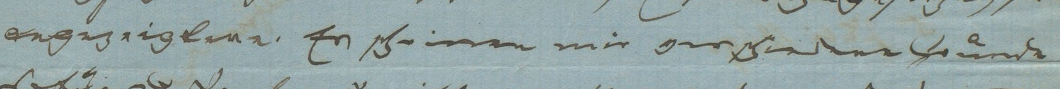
angezeigtere. Es scheinen mir verschiedene Gründe
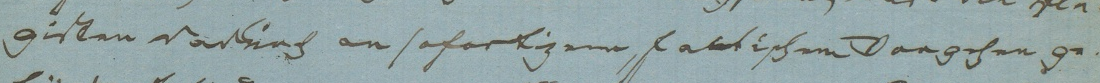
gisten dadurch an sofortigem, factischem Vorgehen ge-
